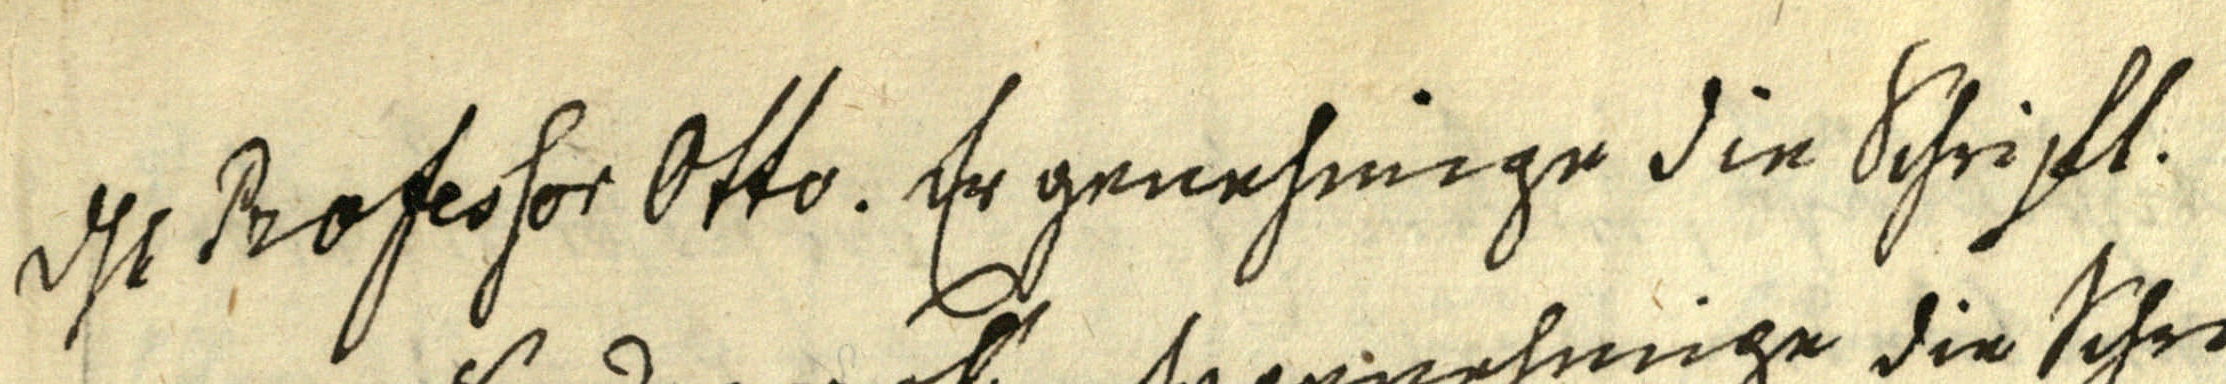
dh Professor Otto. Er genehmige die Schrift.
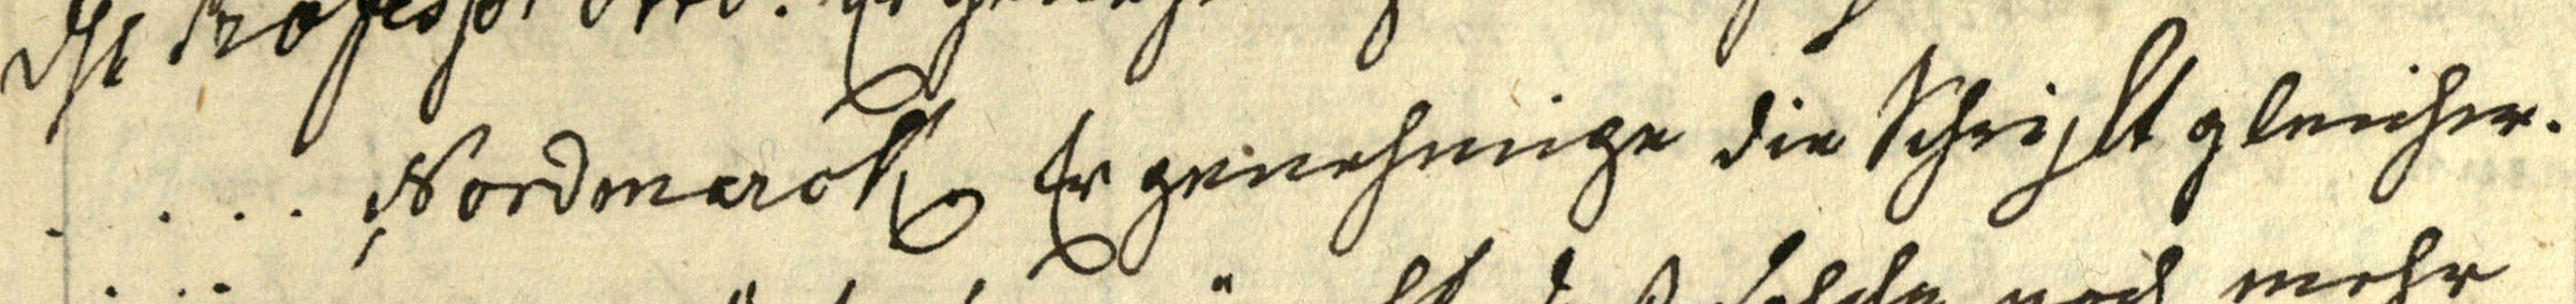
Nordmarck Er genehmige die Schrift gleicher¬
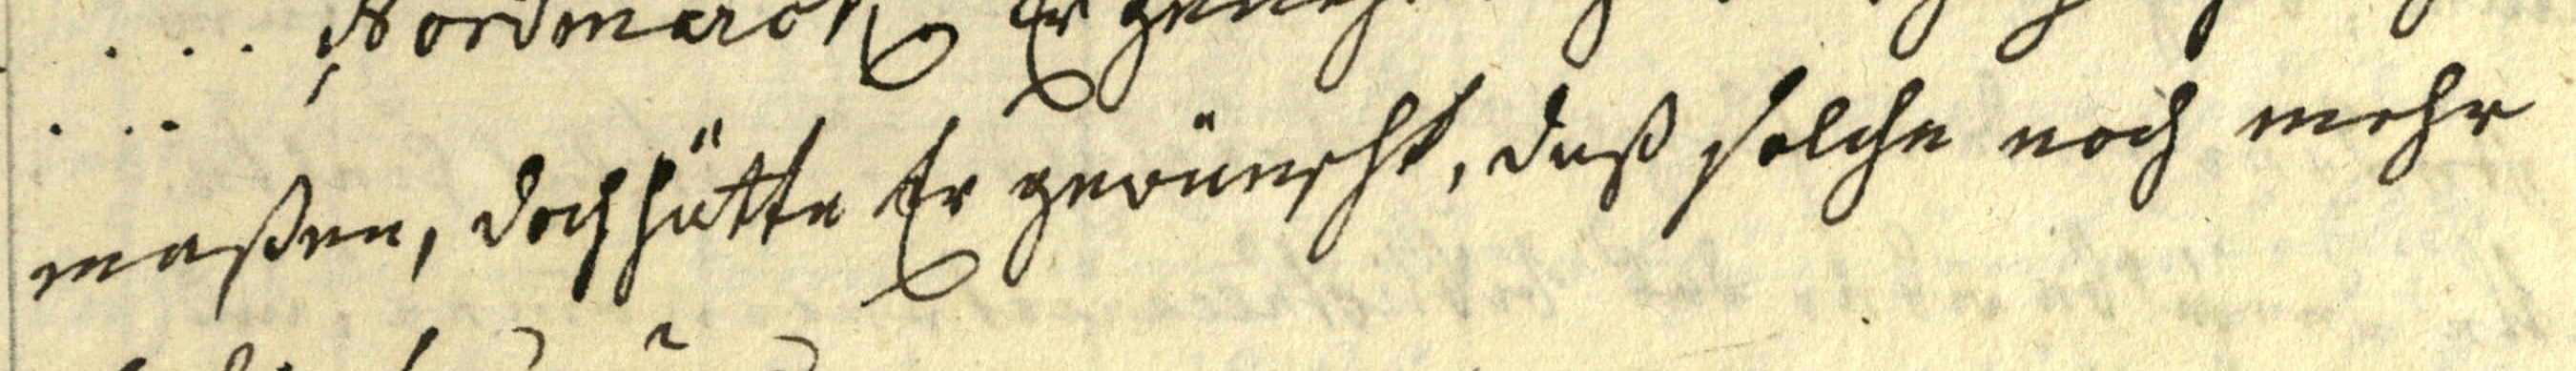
maßen, doch hätte Er gewünscht, daß solche noch mehr
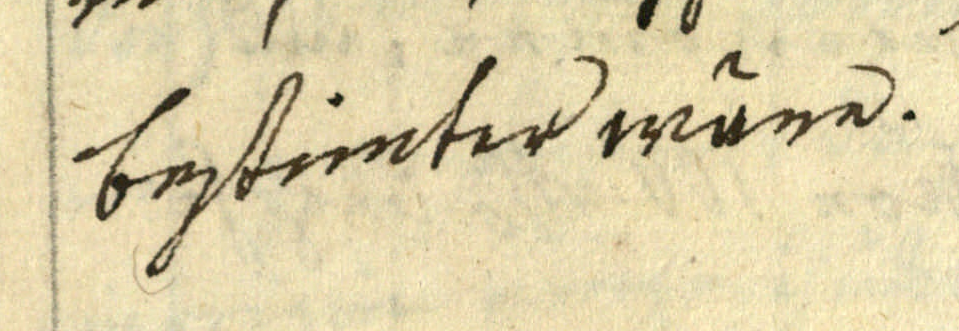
bestimter wäre.
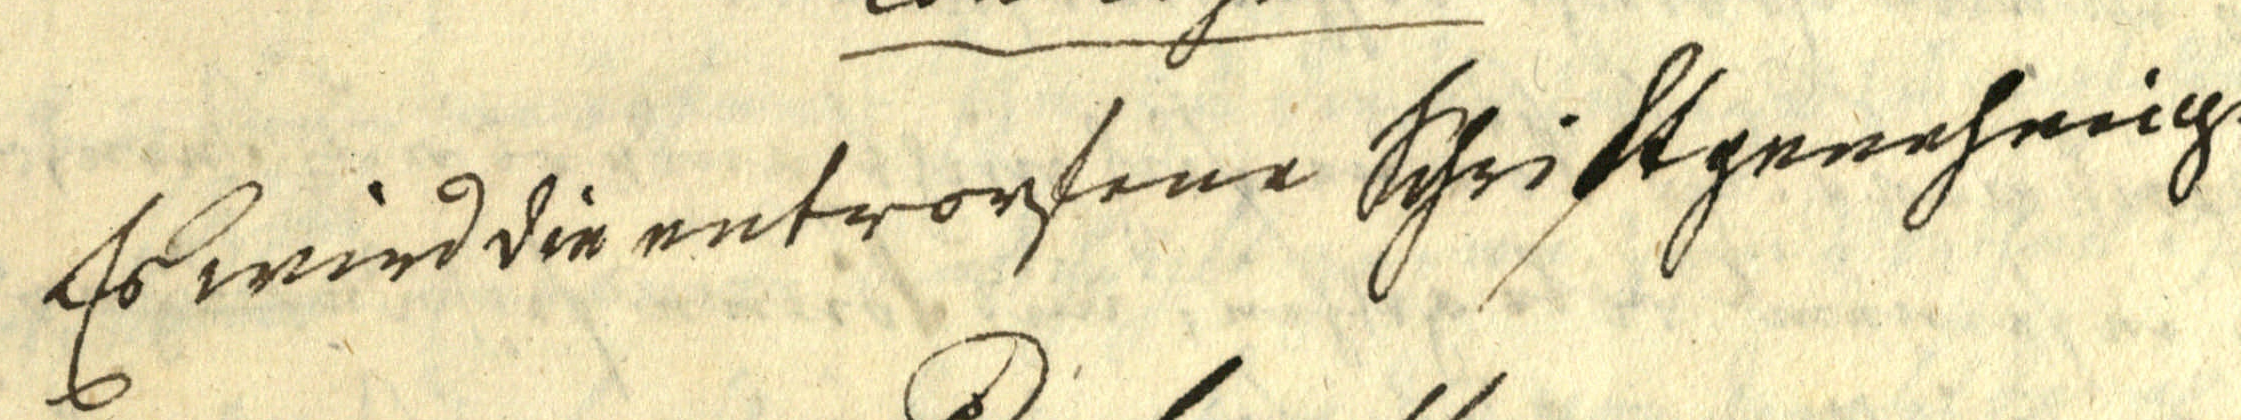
Es wird die entworfene Schrift genehmiget.
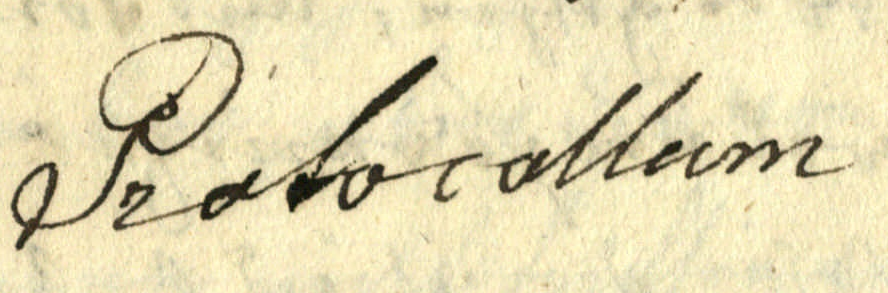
Protocollum
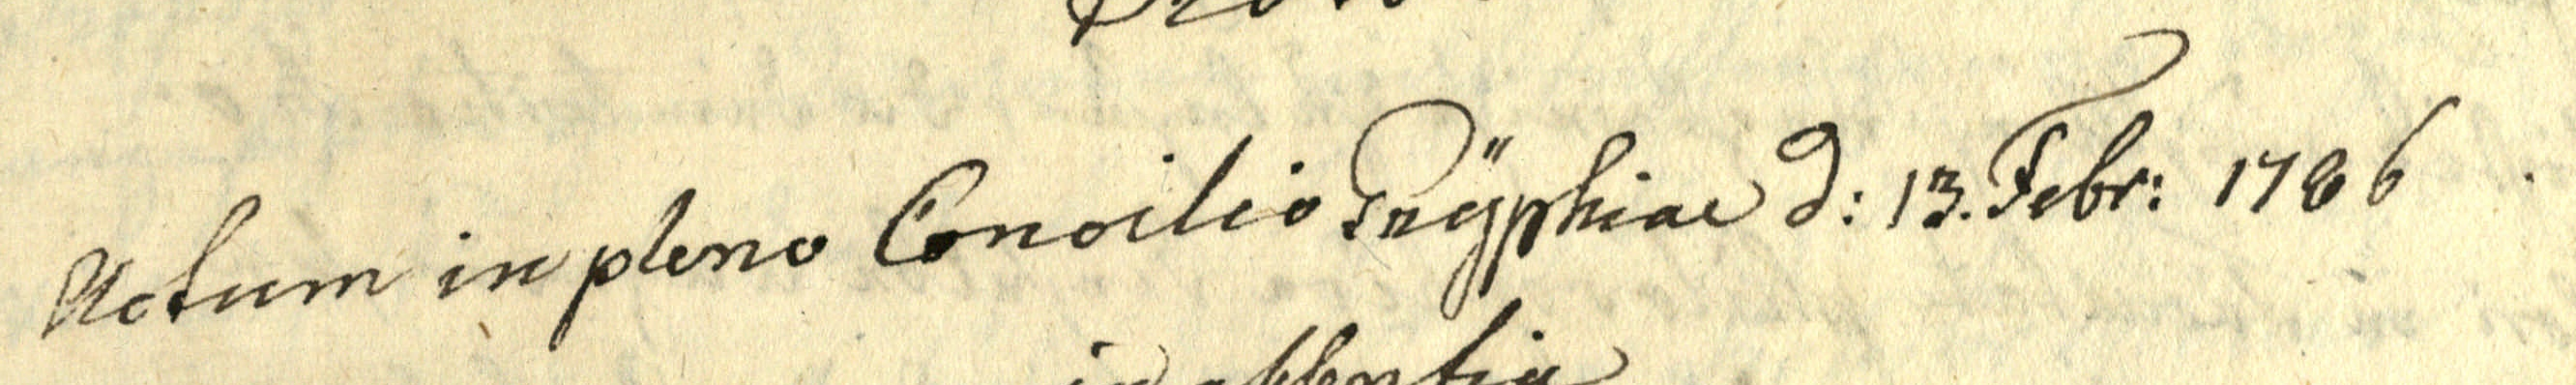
Actum in pleno Concilio Grÿphiae d. 13. Febr. 1786
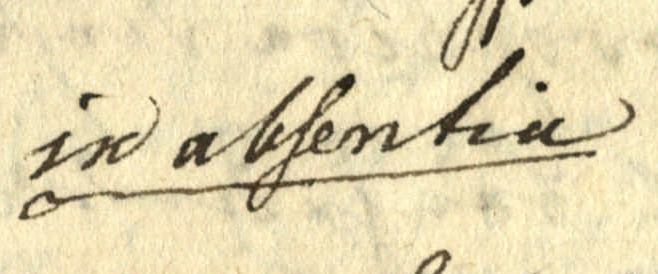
in absentia
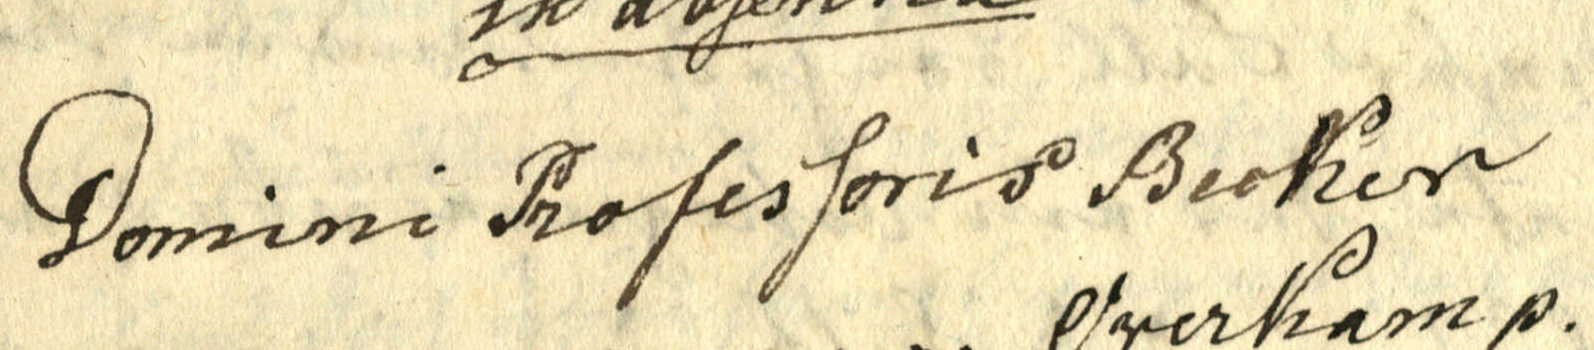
Domini Professoris Becker
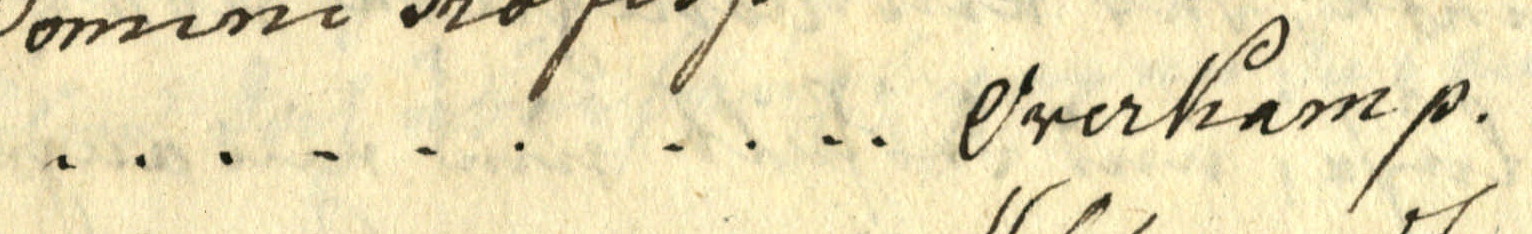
Overkamp.
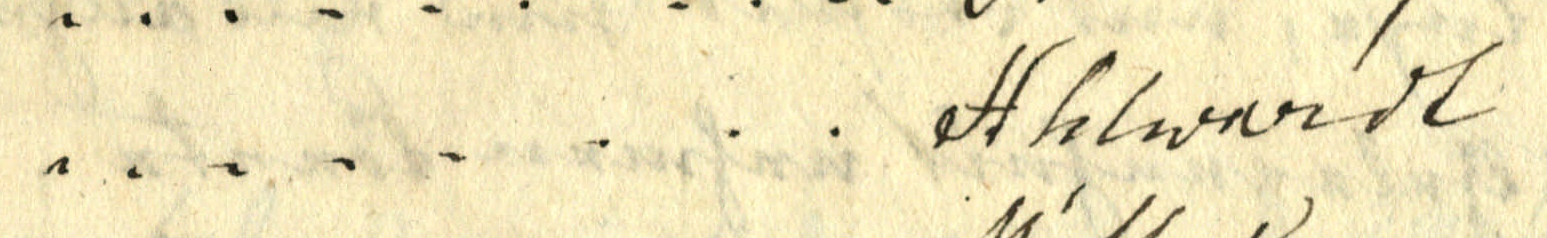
Ahlwardt
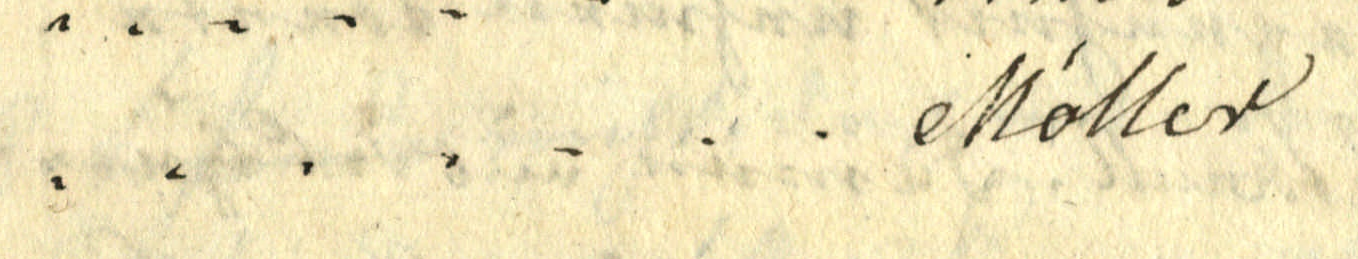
Möller
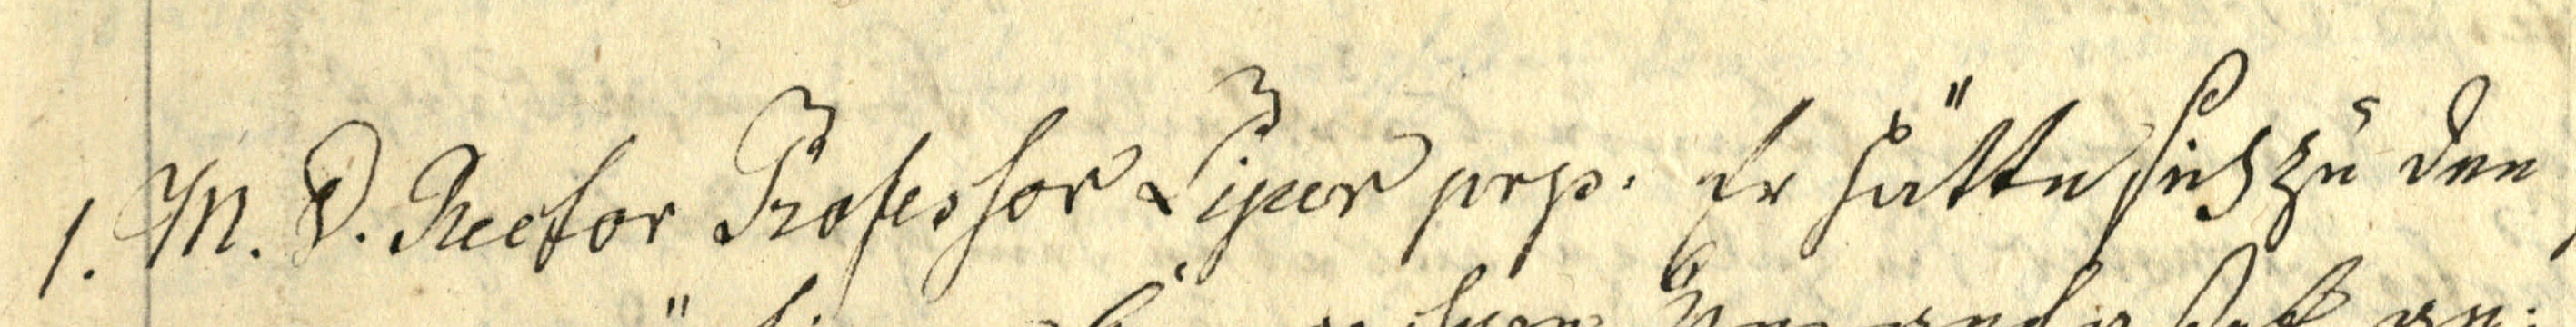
1. M. D. Rector Professor Piper prp. Er hätte sich zu dem
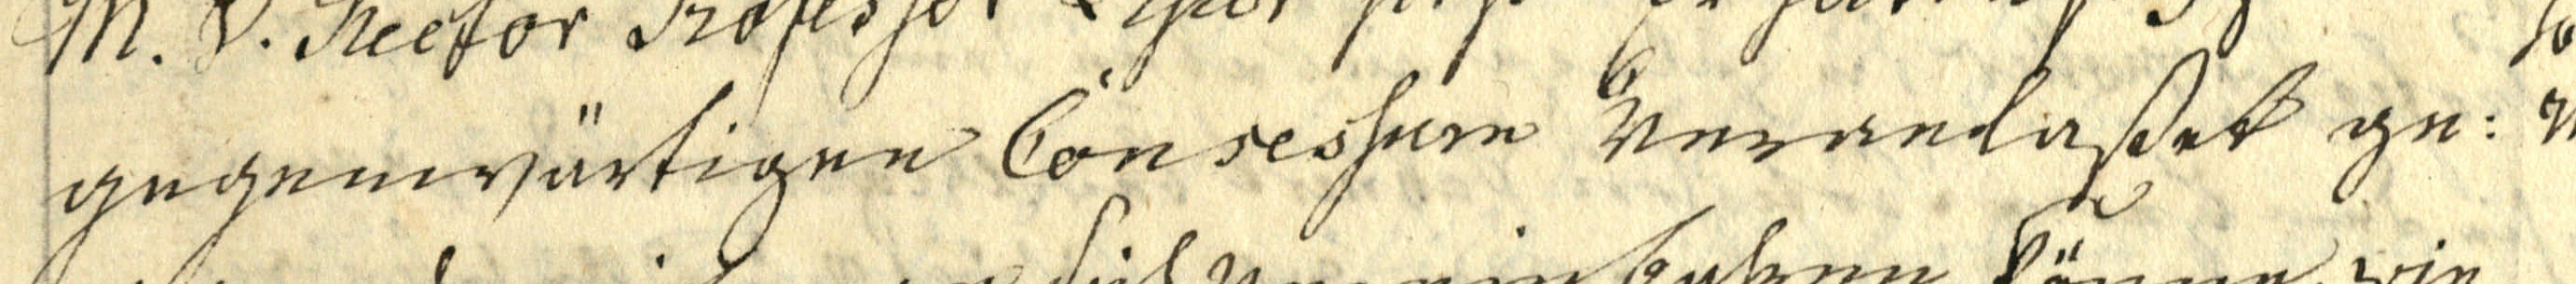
gegenwärtigen Consessum veranlaßet ge¬
